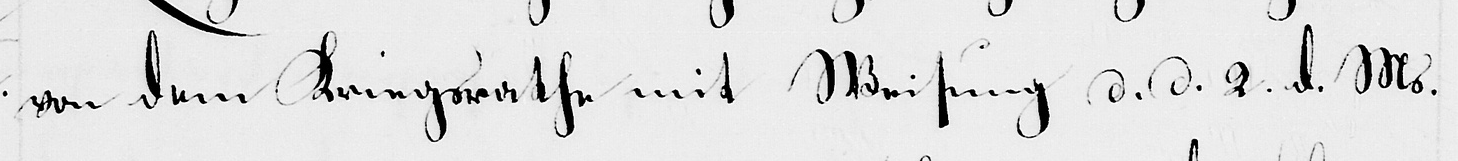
von dem Kriegsrathe mit Weisung d. d. 2. d. Ms.
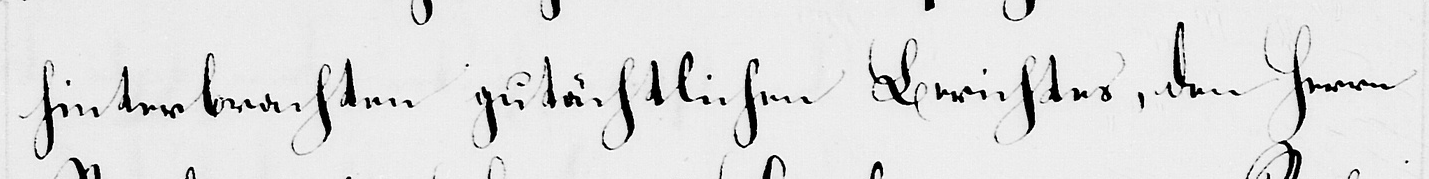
hinterbrachten gutächtlichen Berichtes, den Herrn
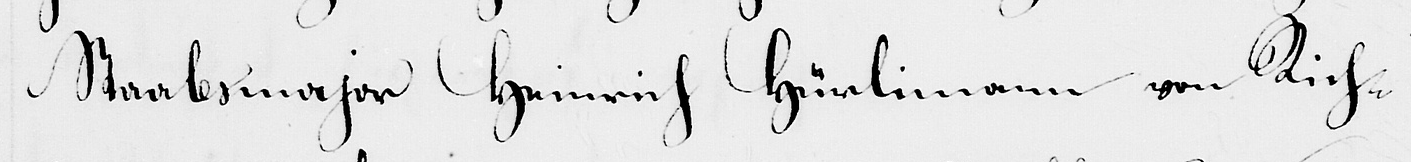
Staabsmajor Heinrich Hürlimann von Rich¬
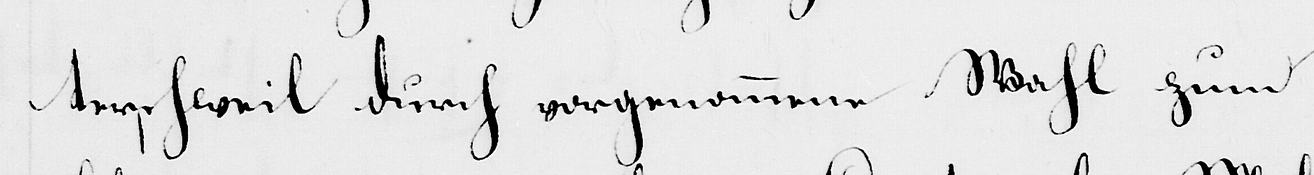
terschweil durch vorgenommene Wahl zum
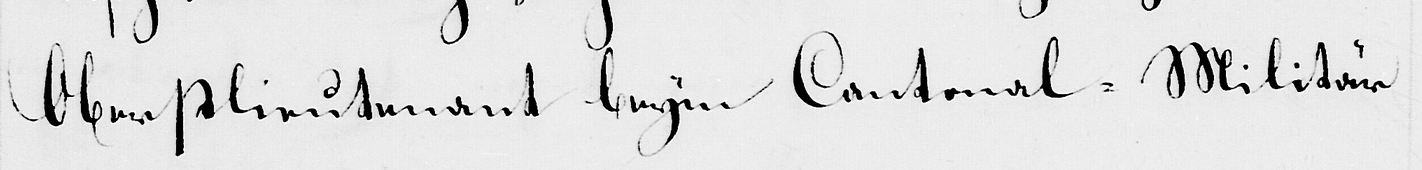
Oberstlieutenant beym Cantonal-Militär
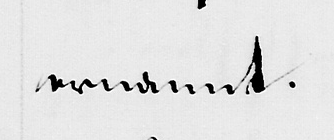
ernannt.
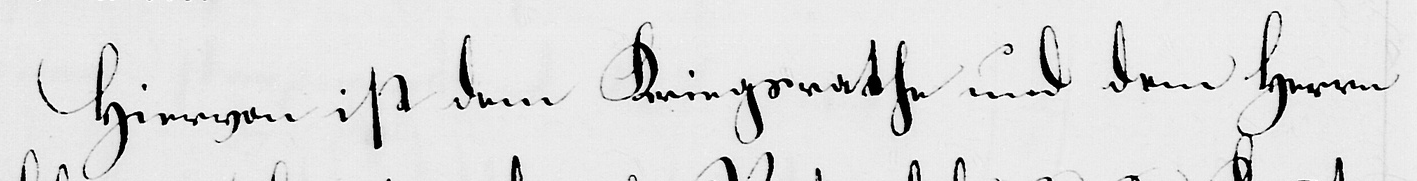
Hiervon ist dem Kriegsrathe und dem Herrn
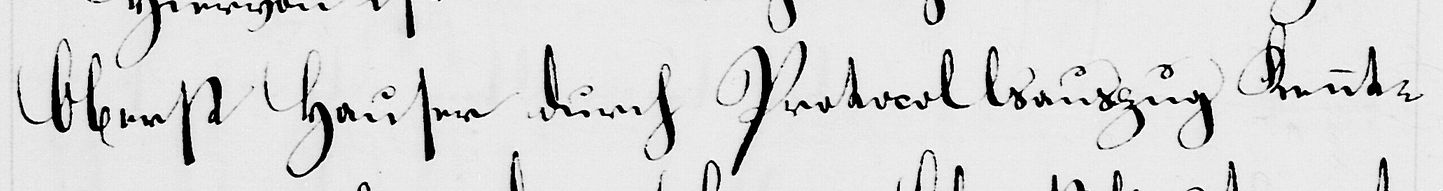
Oberst Hauser durch Protocollsauszug Kennt¬
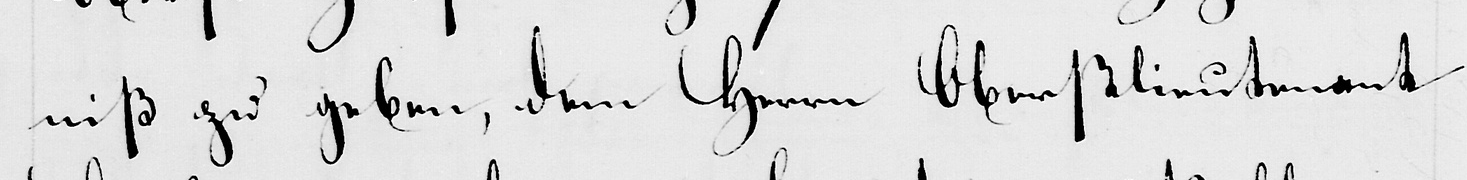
niß zu geben, dem Herrn Oberstlieutenant
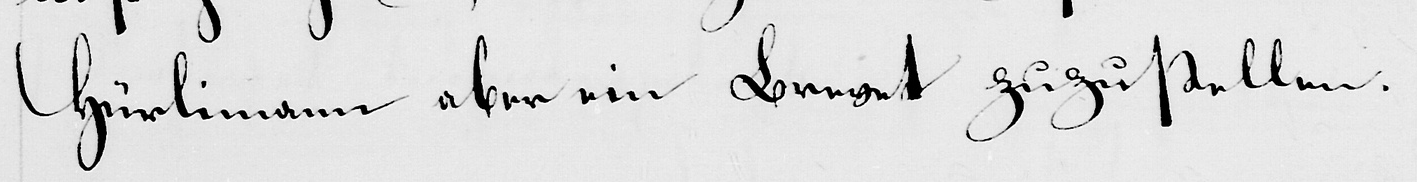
Hürlimann aber ein Brevet zuzustellen.
